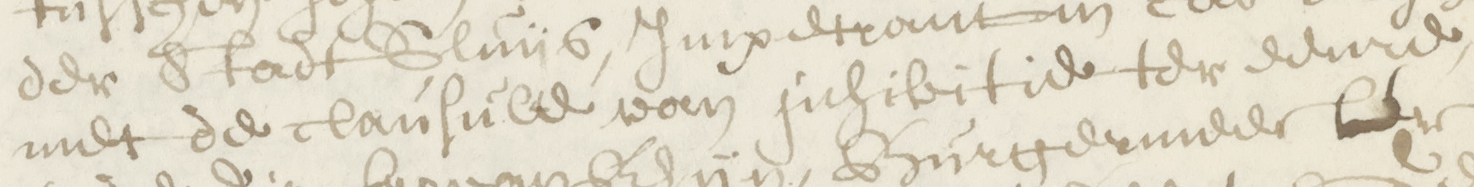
met de clausule van inhibitie ter eenre
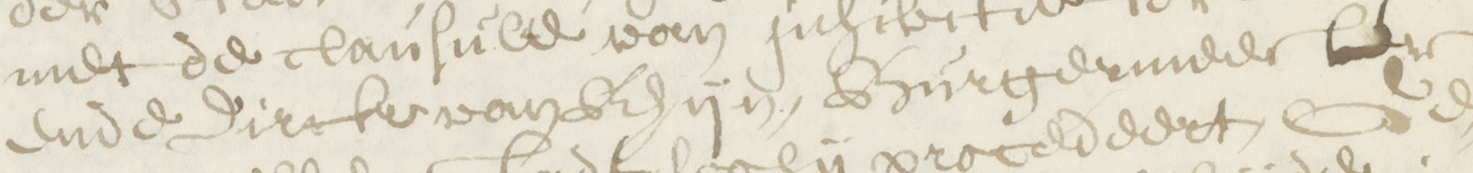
ende Dirck van Rhijn, Burgermeester
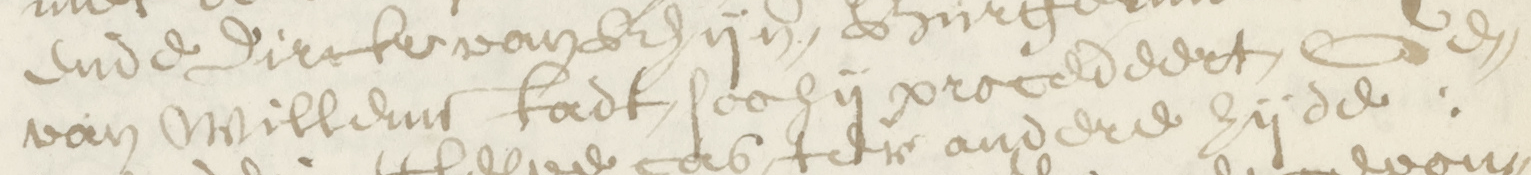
van Willemstadt, soo hij procedeert. Ge„
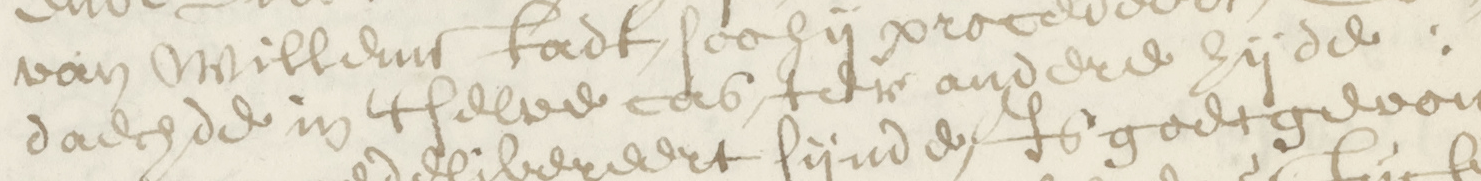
daechde in 'tselve cas, ter andere zijde:
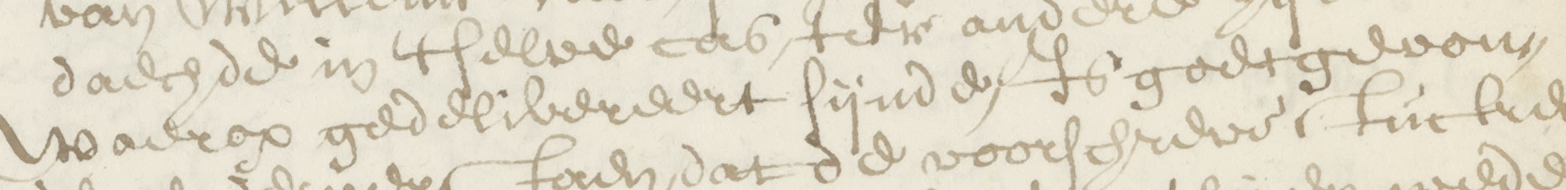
Waerop gedelibereert sijnde, Is goetgevon„
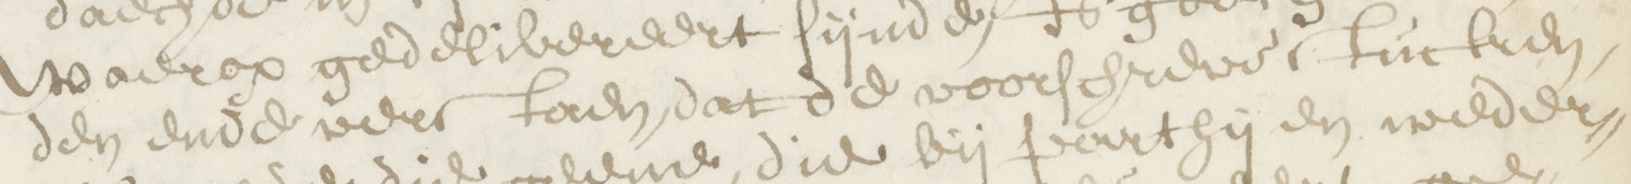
den ende verstaen, dat de voorschreve stucken,
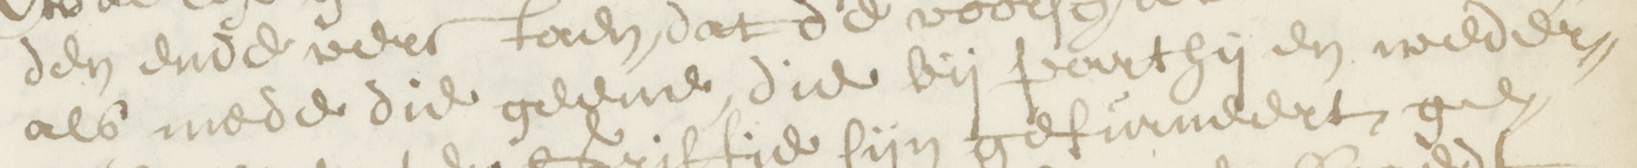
als mede die geene, die bij parthij en weder„
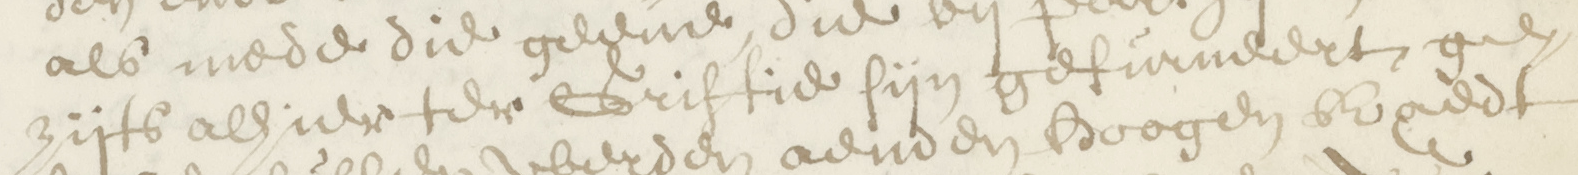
zijts alhier ter Griffie sijn gefurneert, ge„
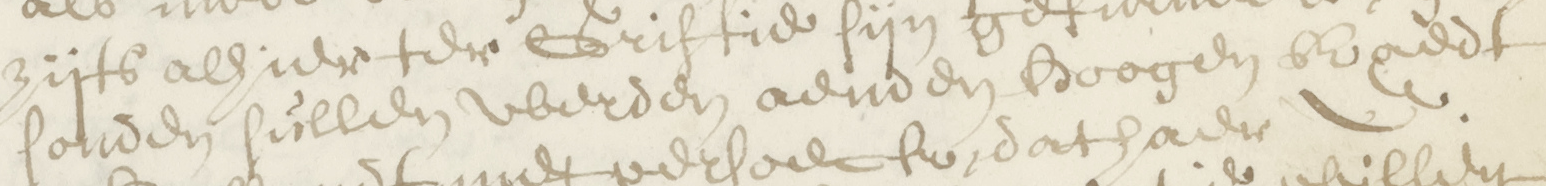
sonden sullen werden aenden Hoogen Raedt
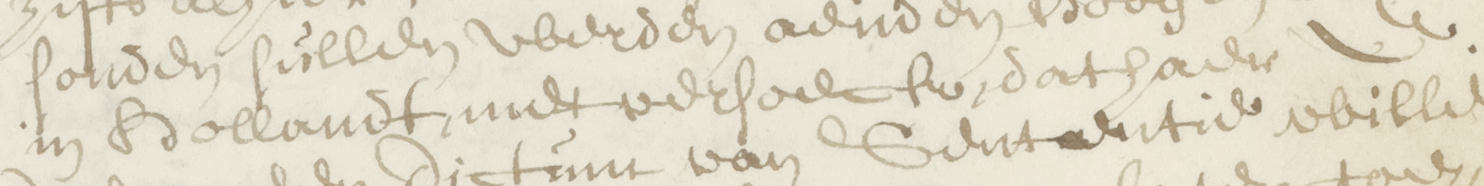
in Hollandt met versoeck, dat haer E.
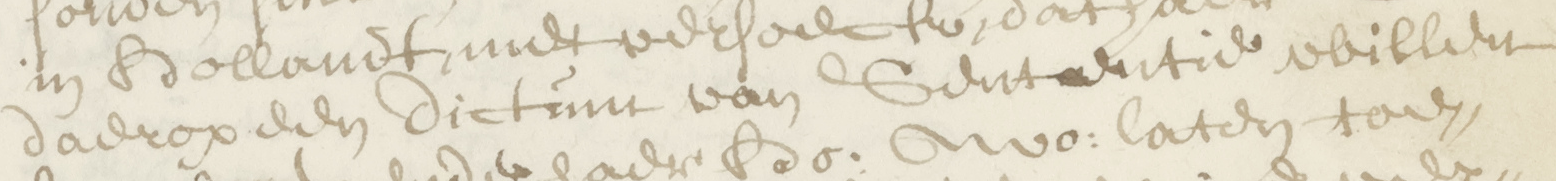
daerop een dictum van Sententie willen
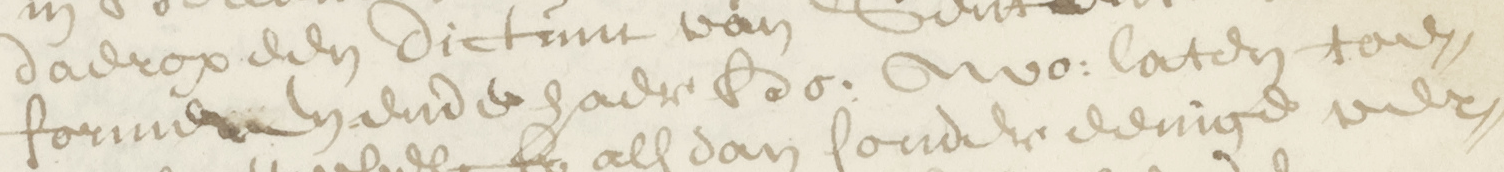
formeren ende haer Ho:Mo: laten toe„
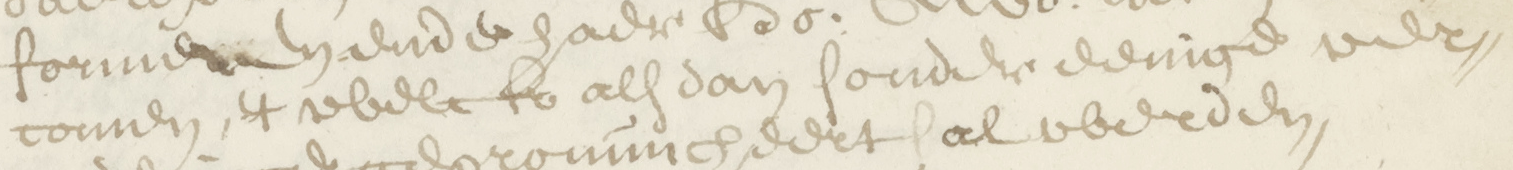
comen, 't welck alsdan sonder eenige ver„
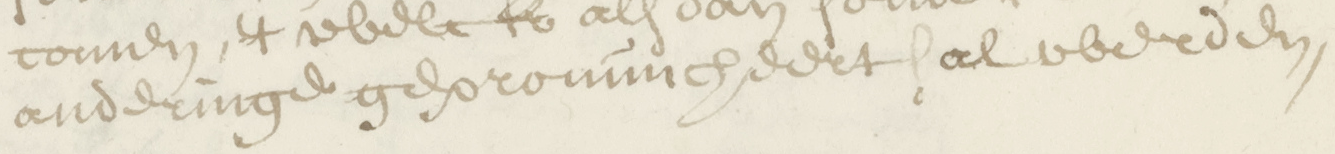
anderinge gepronuncheert sal werden.
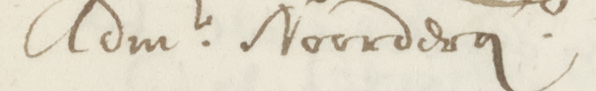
Admt. Noorderqr.
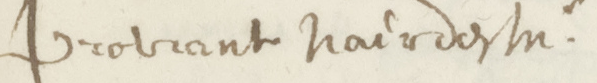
Proviant naer den me.
